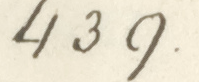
439.
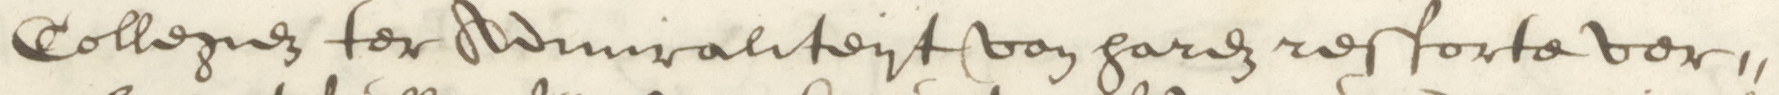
Collegien ter Admiraliteijt van haren ressorte ver„
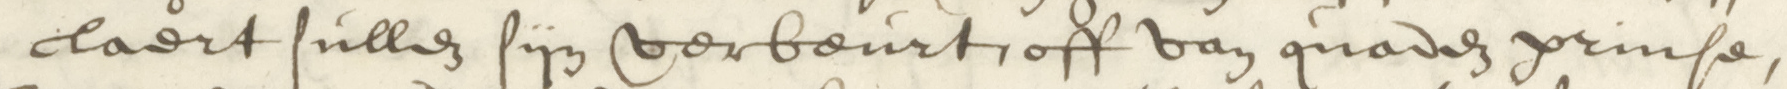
claert sullen sijn verbeurt, off van quaden prinse,
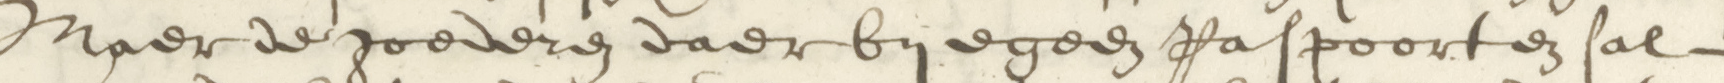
Maer de goederen daerbij egeen paspoort en sal
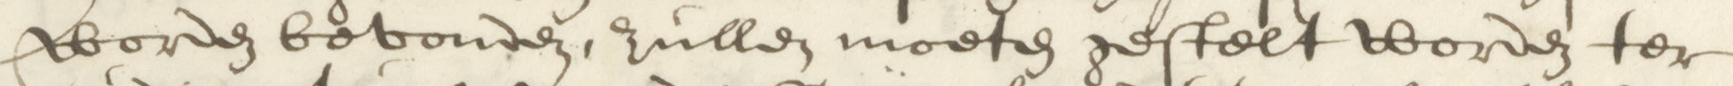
worden bevonden, zullen moeten gestelt worden ter
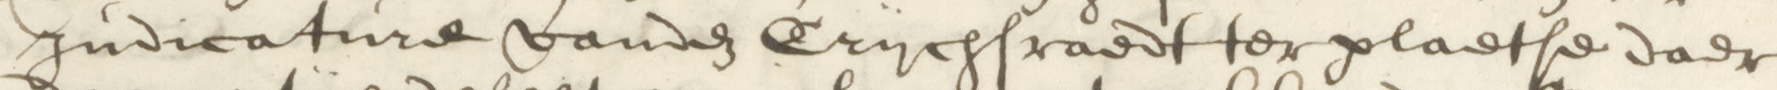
Judicature vanden Crijchsraedt ter plaetse daer
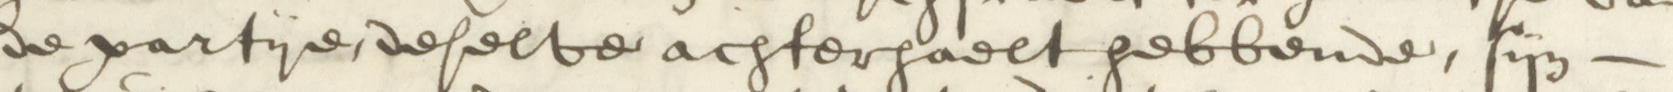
de partije, deselve achterhaelt hebbende, sijn —
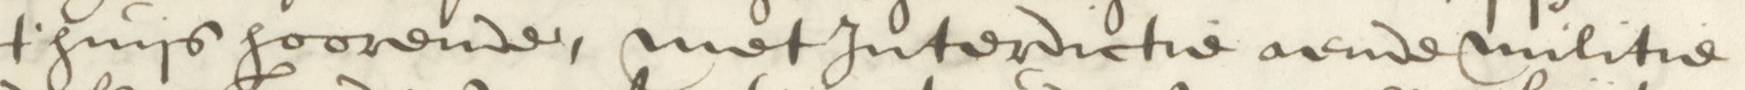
thuijs hoorende, met Interdictie aende militie
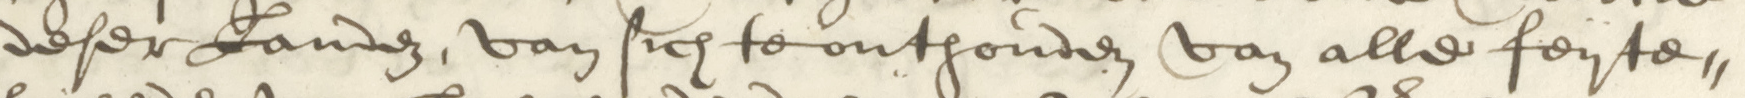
deser Landen, van sich te onthouden van alle feijte„
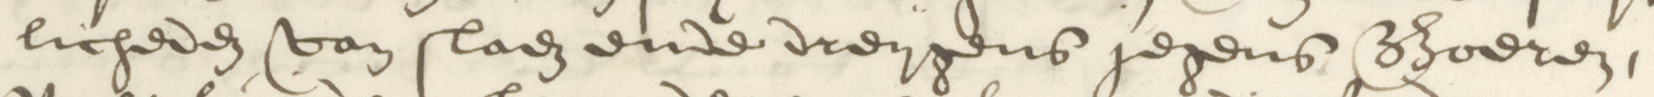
licheden van slaen ende dreijgens jegens Boeren,
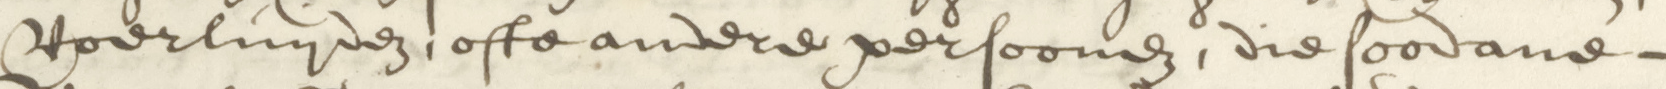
Voerluijden, ofte andere persoonen, die soodane
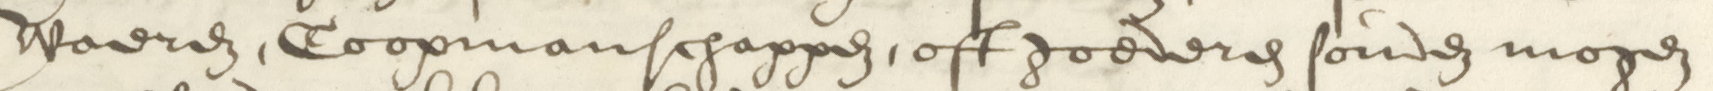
Waeren, Coopmanschappen, off goederen souden mogen
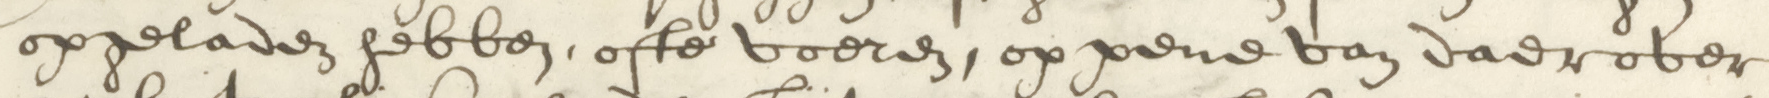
opgeladen hebben, ofte voeren, op pene van daerover
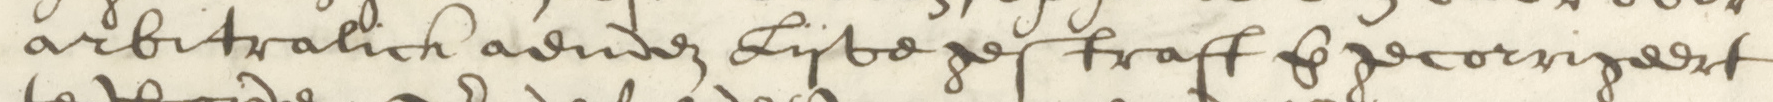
arbitralick aenden Lijve gestraft & gecorrigeert
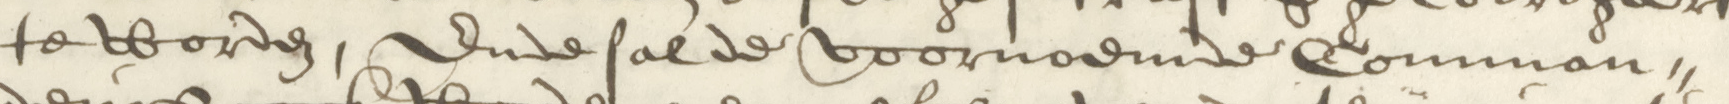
te worden. Ende sal de voornoemde Comman„
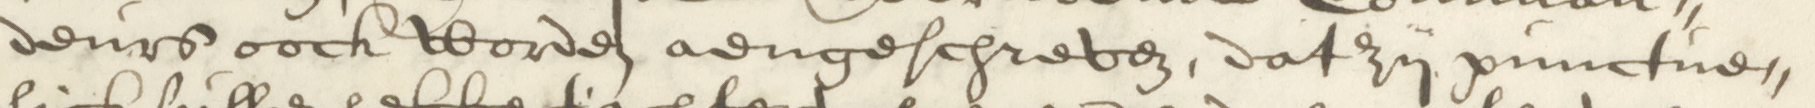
deurs oock worden aengeschreven, dat zij punctue„
